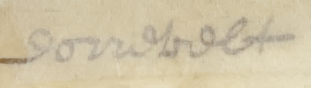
Dorrevelt,
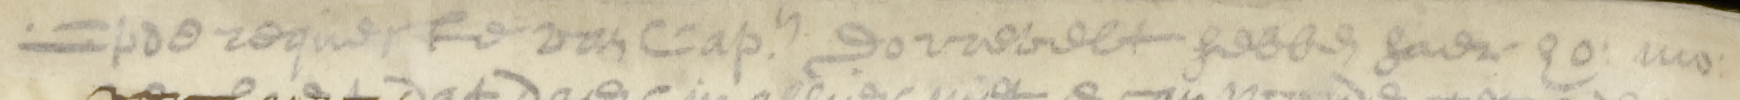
Opde requeste van Capn. Dorrevelt hebben haer ho:mo:
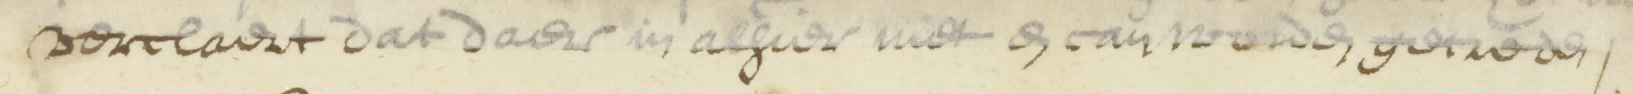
verclaert dat daer in alhier niet en can worden getreden.
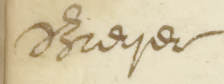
Breyer
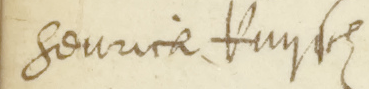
henrick Ruysch
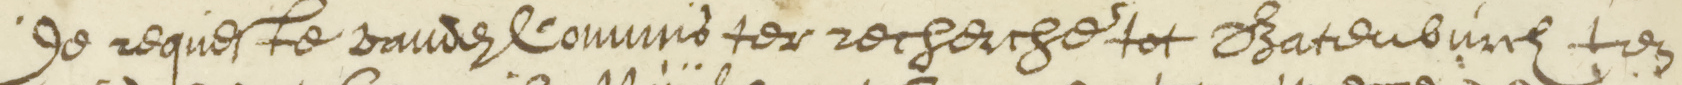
De requeste vanden Commis ter recherche tot Batenburch ten
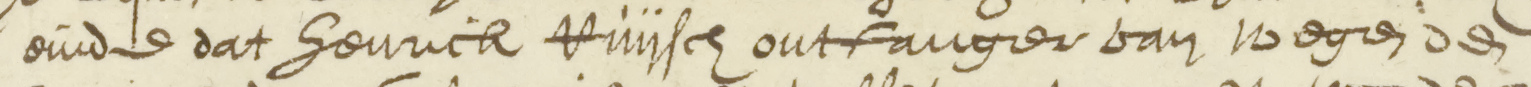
einde dat Henrick Ruijsch ontfanger van wegen den
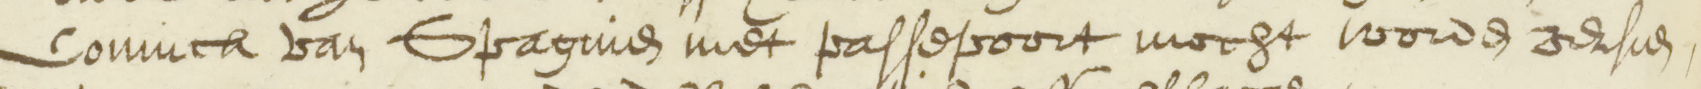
coninck van Spagnien met passepoort mocht worden versien,
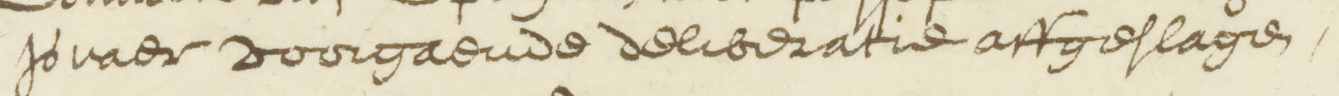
Is naer voorgaende deliberatie affgeslagen.
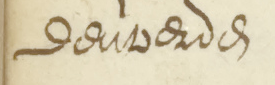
Deuverden
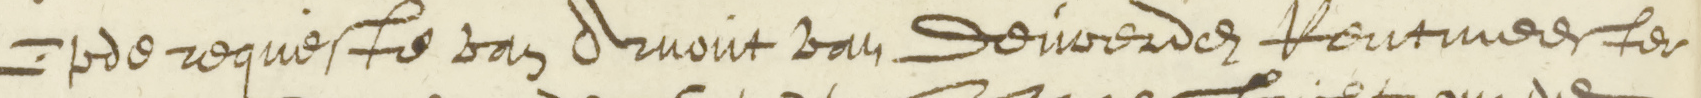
Opde requeste van Arnout van Deuverden Rentmeester,
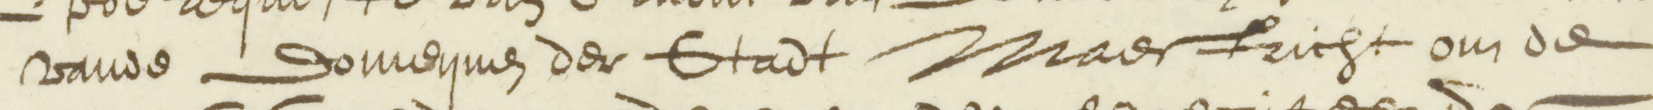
vande Domeynen der Stadt Maestricht om de
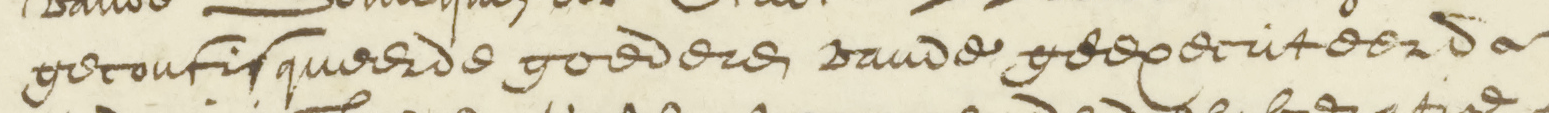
geconfisqueerde goederen vande geexecuteerde
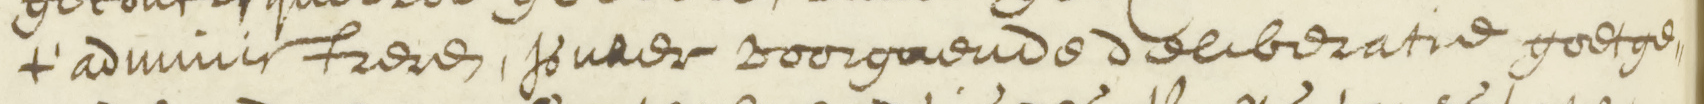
t' administreren, Is naer voorgaende deliberatie goetge„
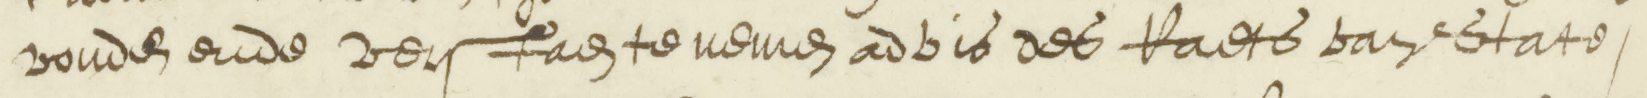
vonden ende verstaen te nemen advis des Raets van State.
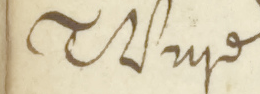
TVrije
